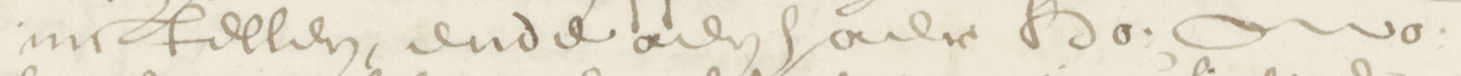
instellen, ende aen haer Ho:Mo:
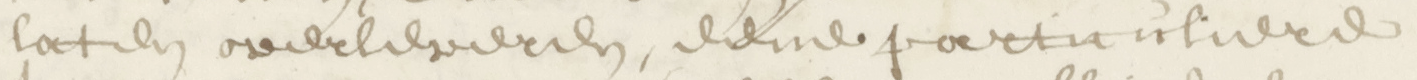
laten overleveren, eene particuliere
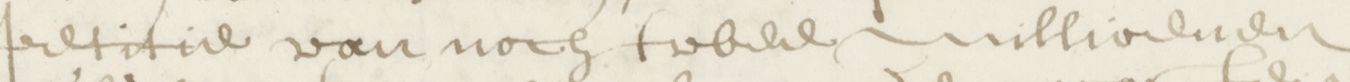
petitie van noch twee millioenen
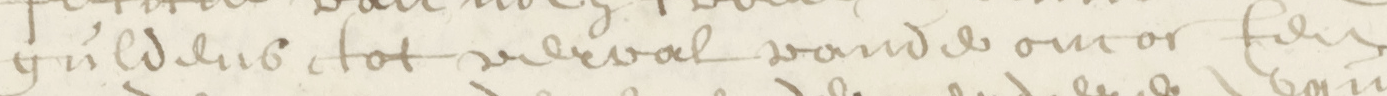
guldens, tot verval vande oncosten
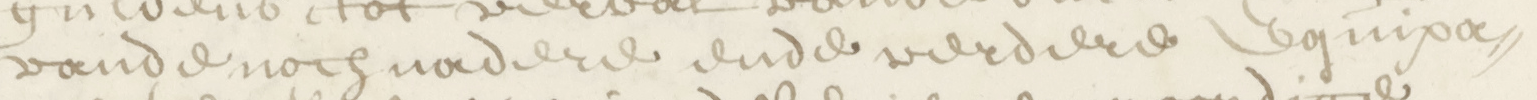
vande noch nadere ende verdere Equipa,,
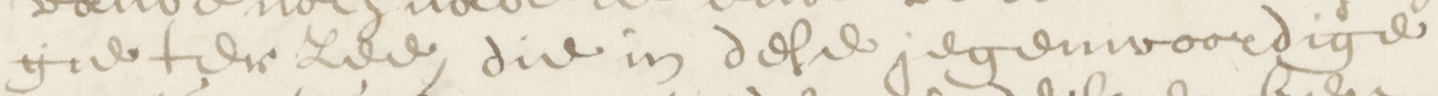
gie ter zee, die in dese jegenwoordige
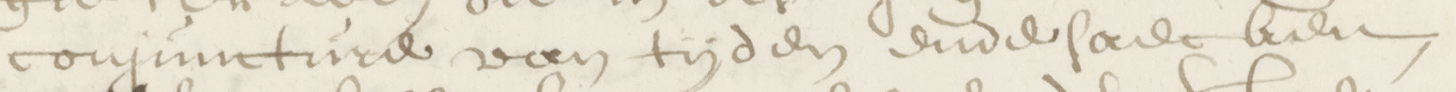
conjuncture van tijden ende saecken,
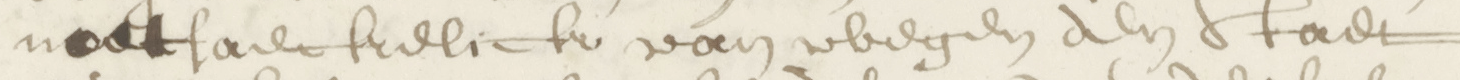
nootsaeckelick van wegen den Staet
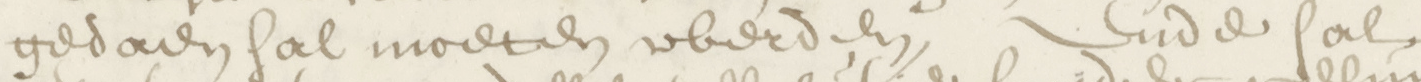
gedaen sal moeten werden. Ende sal
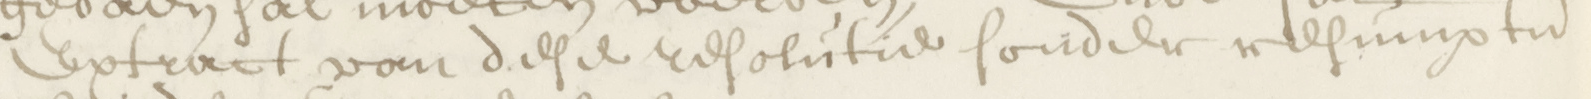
Extract van dese resolutie sonder resumptie
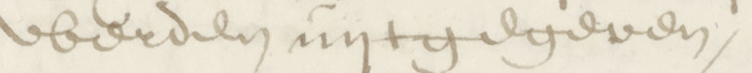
werden uijtgegeven.
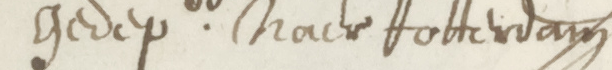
gedepden. naer Rotterdam
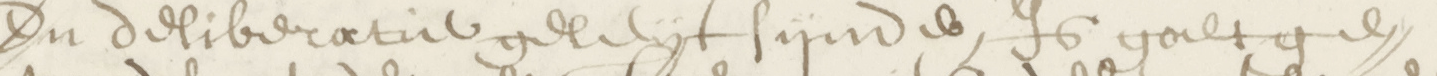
In deliberatie geleijt sijnde, Is goetge,,
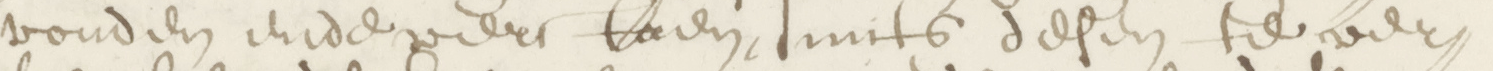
vonden ende verstaen, mits desen te ver,,
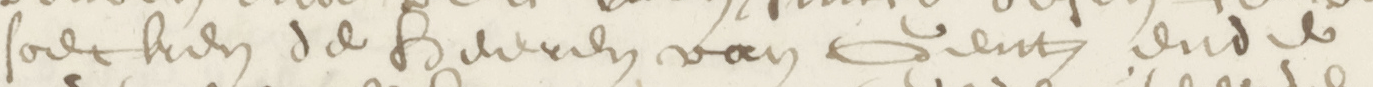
soecken de Heeren van Gent ende
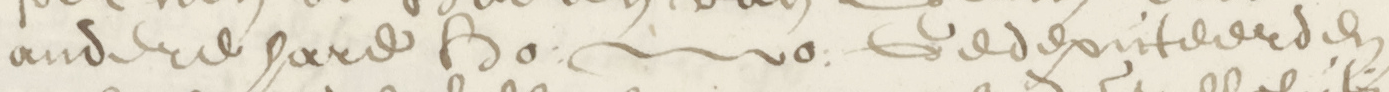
andere hare Ho:Mo: Gedeputeerden
